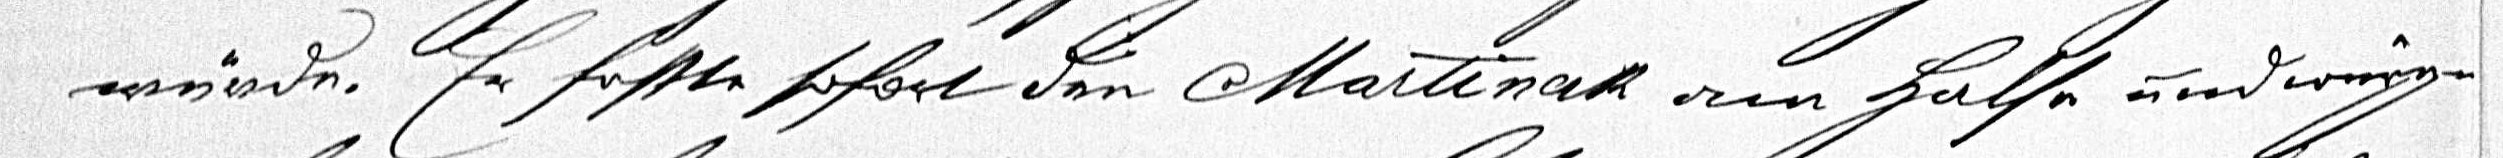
würde. Er faßte sofort den Martinak am Halse und würg¬
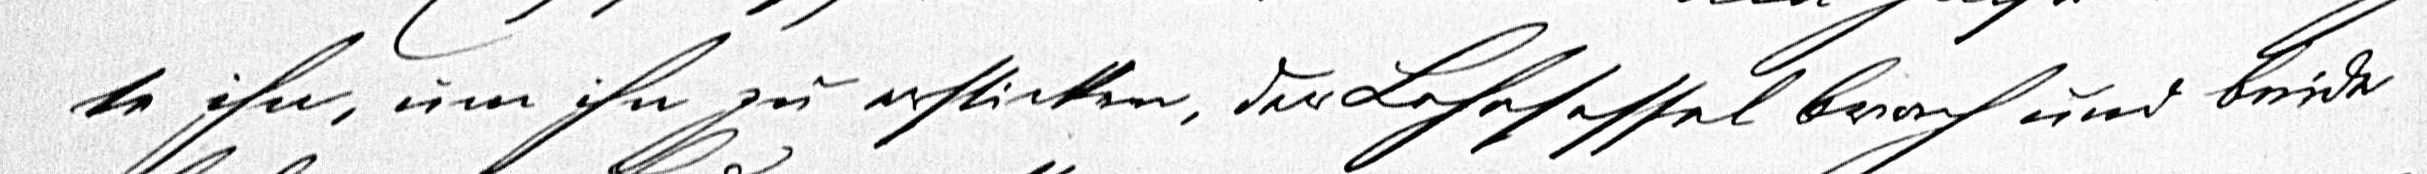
te ihn, um ihn zu ersticken, der Lensessel brach und beide
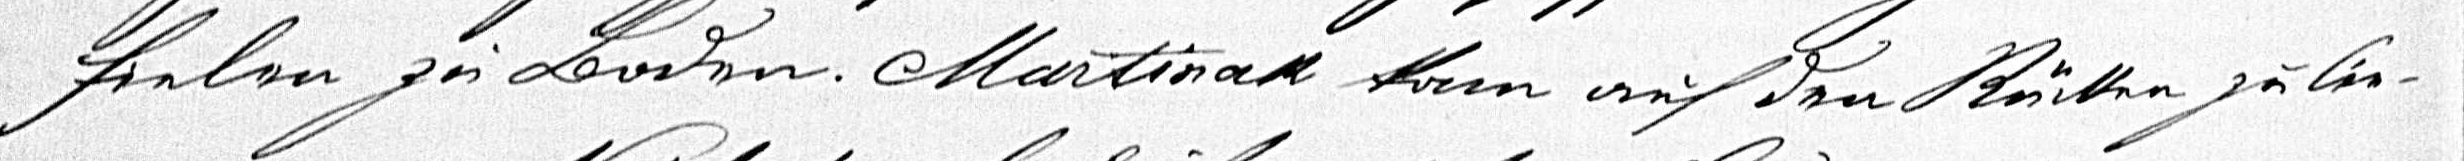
fielen zu Boden. Martinak kam auf den Rücken zu lie¬
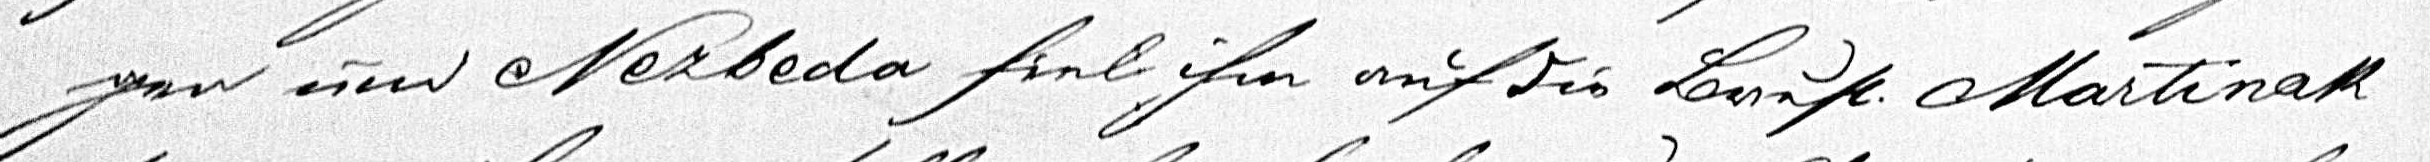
gen und Nezbeda fiel ihm auf die Brust. Martinak
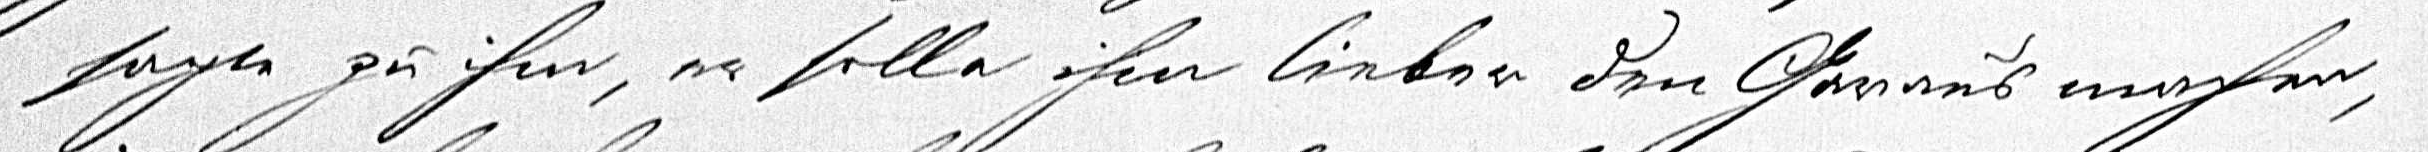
sagte zu ihm, er solle ihm lieber den Garaus machen,
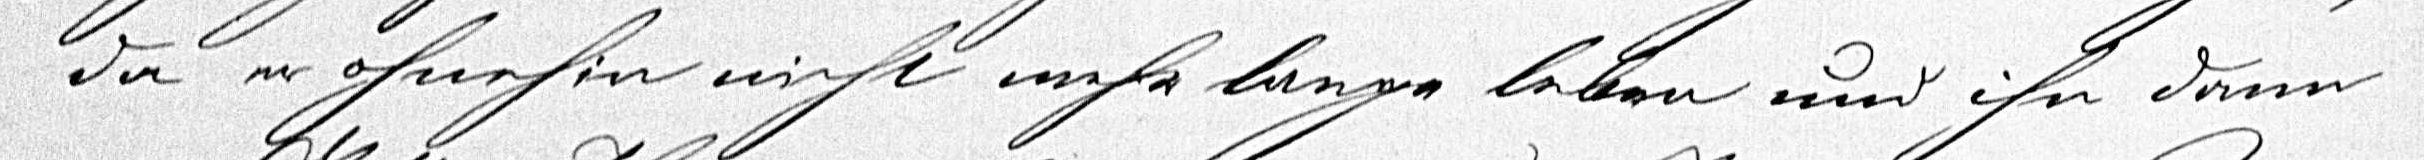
da er ohnehin nicht mehr lange leben und ihn dann
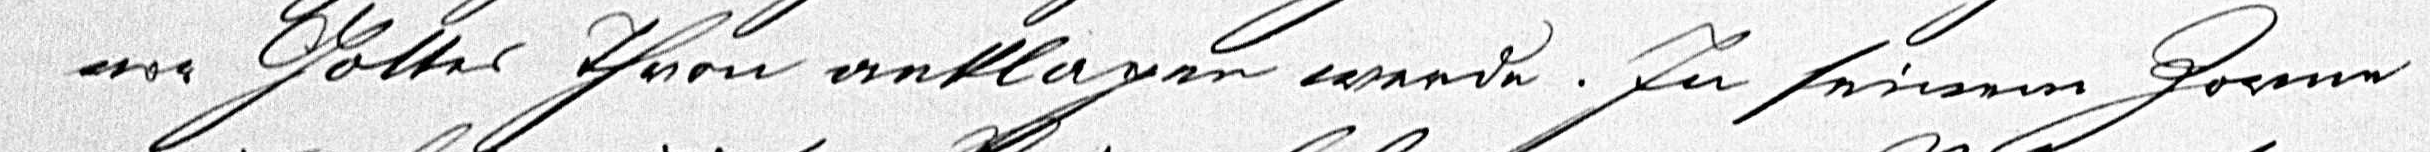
vor Gottes Thron anklagen werde. In seinem Zorne
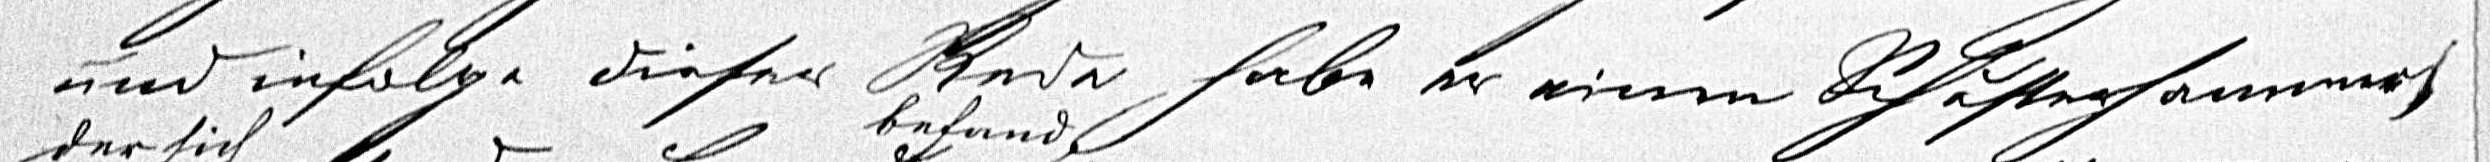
und infolge dieser Rede habe er einen Schusterhammerl
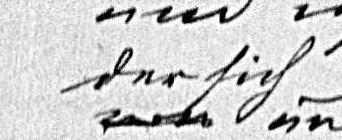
der sich
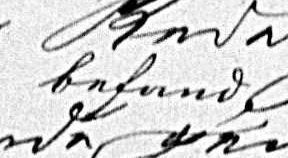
befand
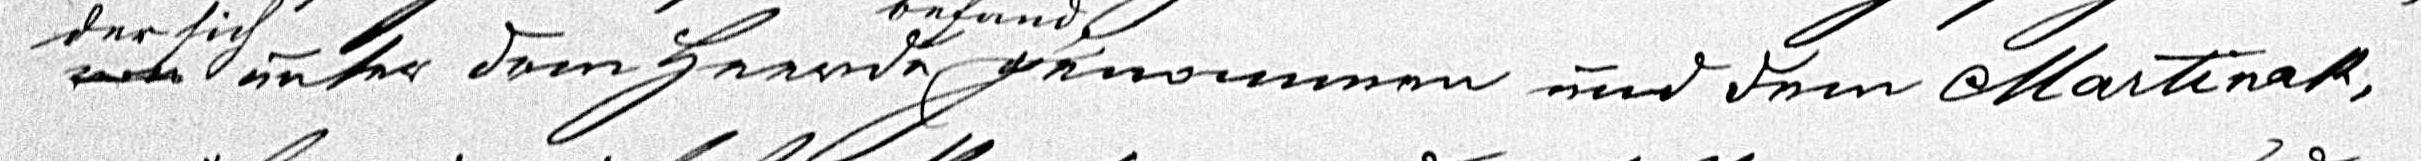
unter dem Heerd genommen und dem Martinak,
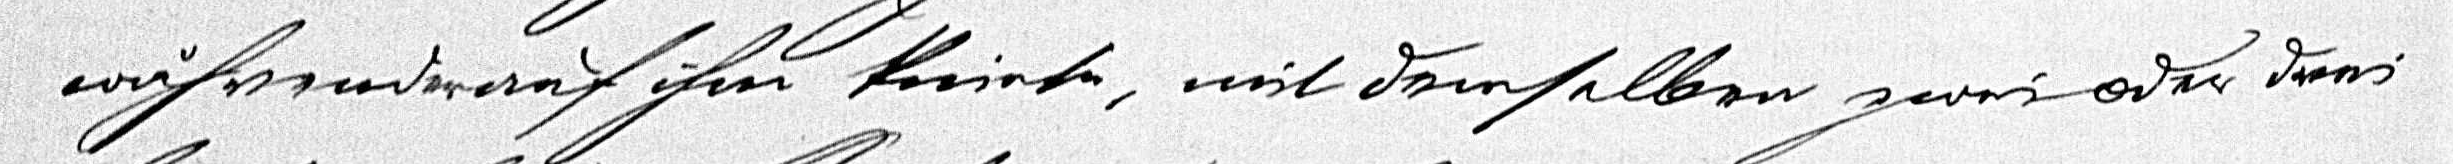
während er auf ihm kniete, mit demselben zwei oder drei
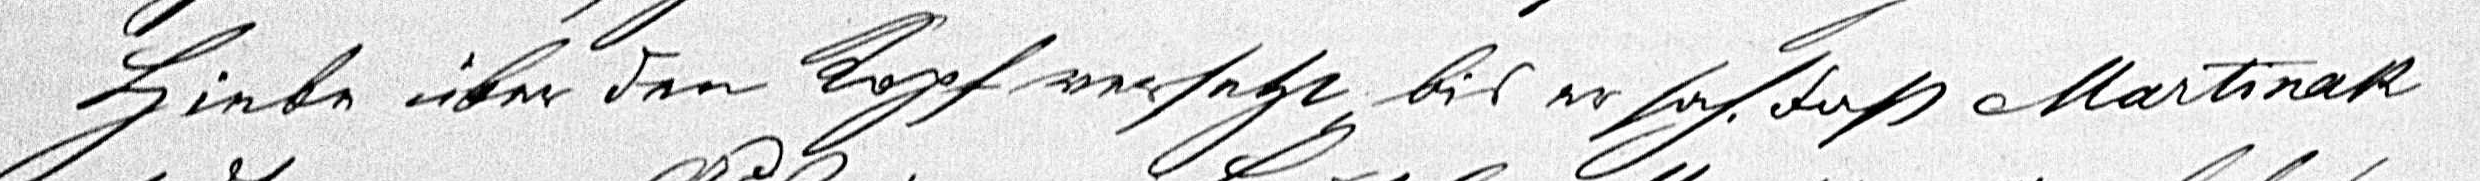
Hiebe über den Kopf versetzt, bis er sah daß Martinak
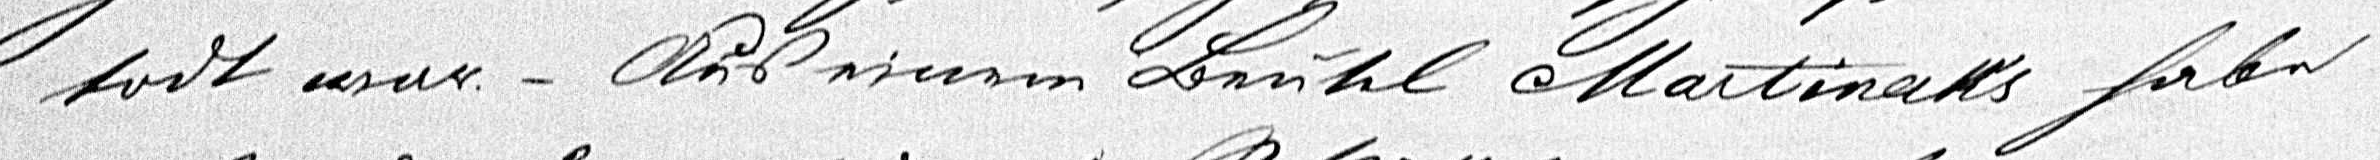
todt war – Aus einem Beutel Martinaks habe
